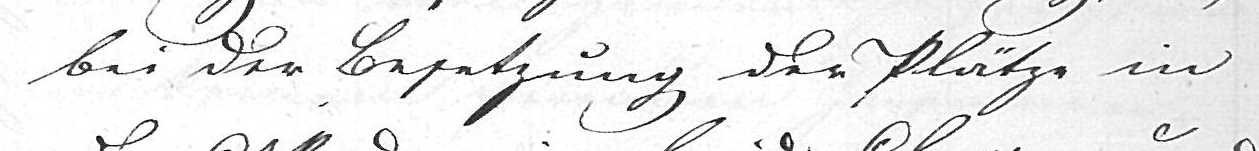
bei der Besetzung der Plätze in
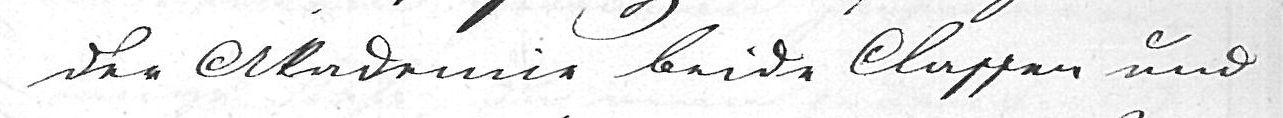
der Akademie beide Classen und
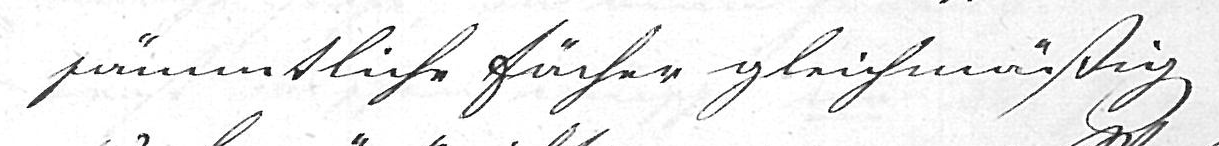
sämmtliche Fächer gleichmäßig
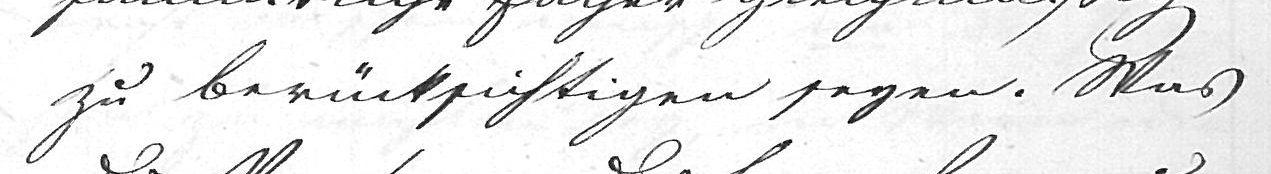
zu berücksichtigen seyen. Was
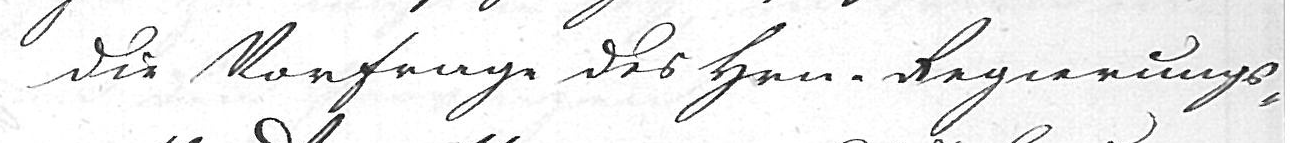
die Vorträge des Hrn. Regierungs-
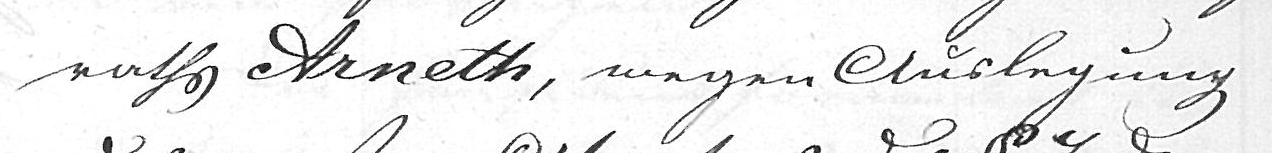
raths Arneth, wegen Auslegung
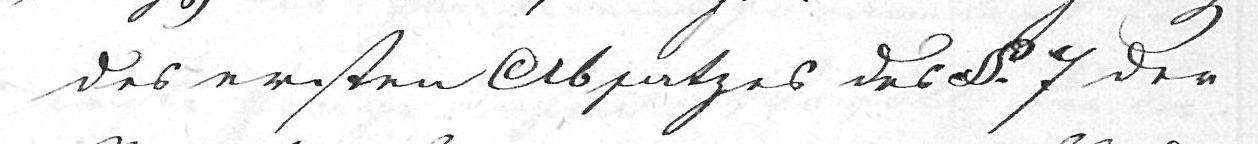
des ersten Absatzes des § 7 der
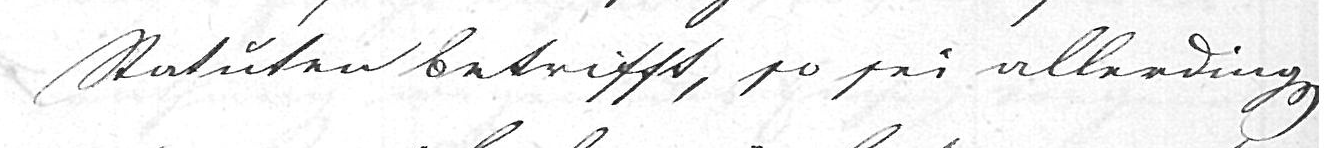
Statuten betrifft, so sei allerdings
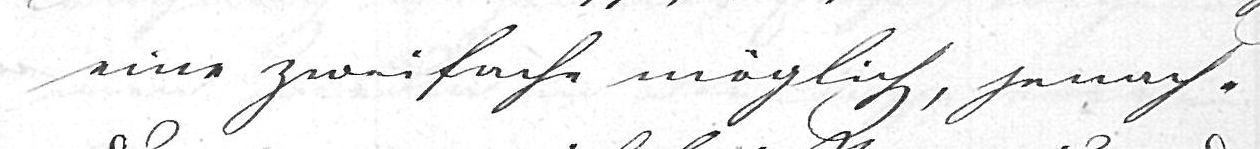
eine zweifache möglich, jenach-
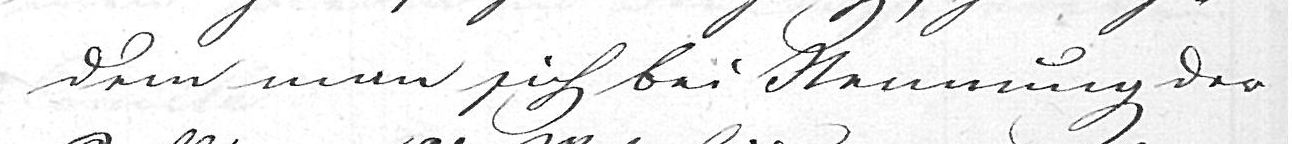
dem man sich bei Nennung der
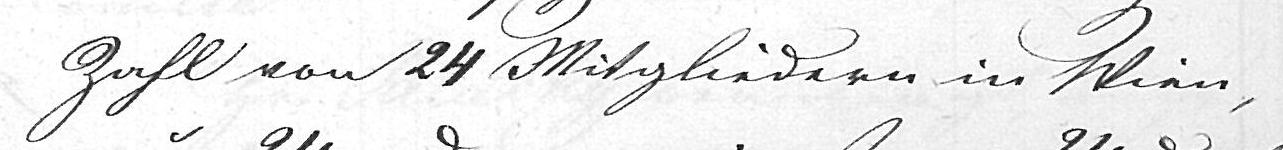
Zahl von 24 Mitgliedern in Wien,
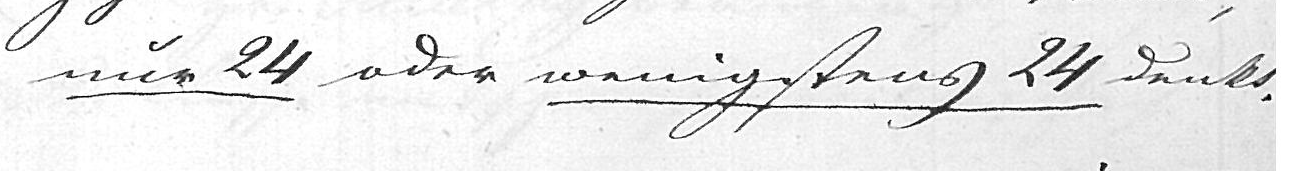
nur 24 oder wenigstens 24 denkt.
